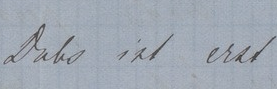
Dubs ist erst
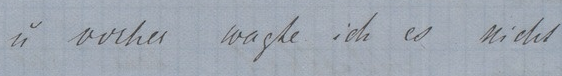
u vorher wagte ich es nicht
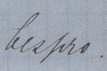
die bespro-
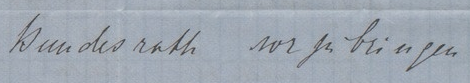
Bundesrath vorzubringen.
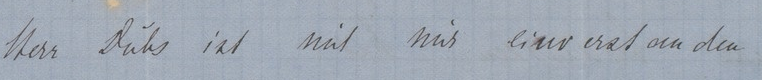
Herr Dubs ist mit mir einverstanden
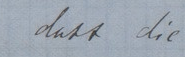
dass die
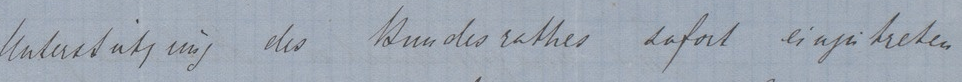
Unterstützung des Bundesrathes sofort einzutreten
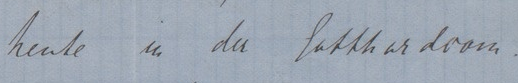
heute in der Gotthardcom-
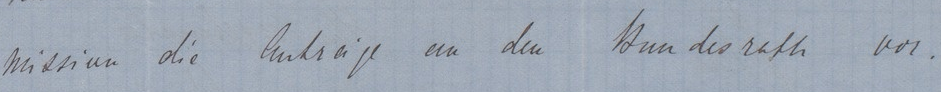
mission die Anträge an den Bunderath vor-
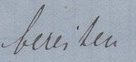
bereiten.
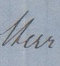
Berlin
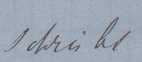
schreibt
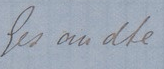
Gesandte
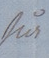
sei
